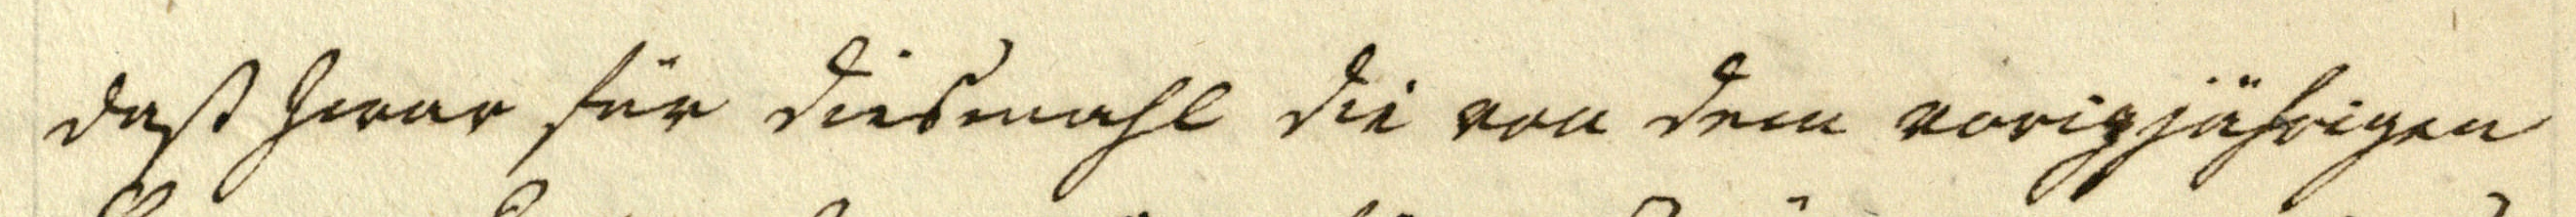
daß zwar für diesmahl dievon dem vorigjährigen
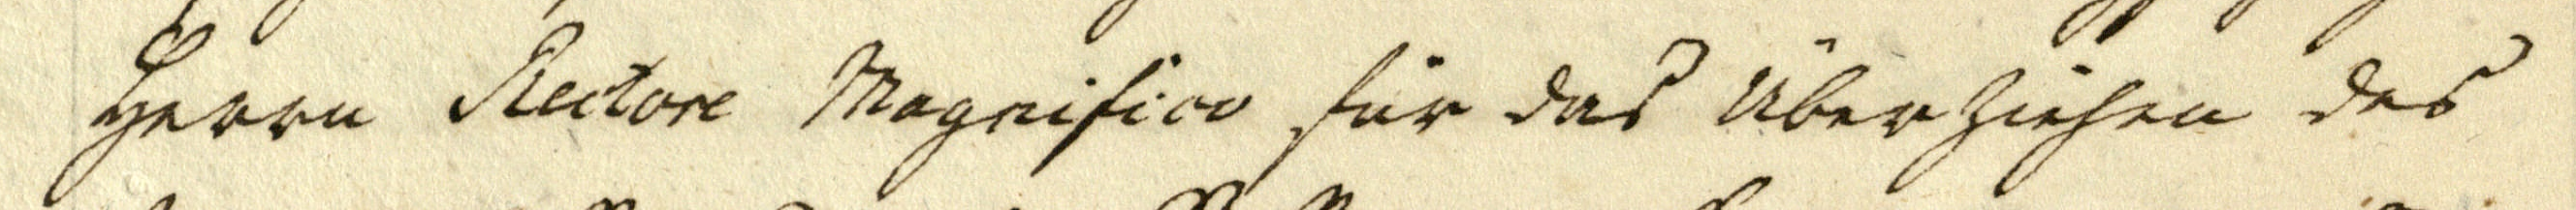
Herrn Rectore Magnifico für das Überziehen des
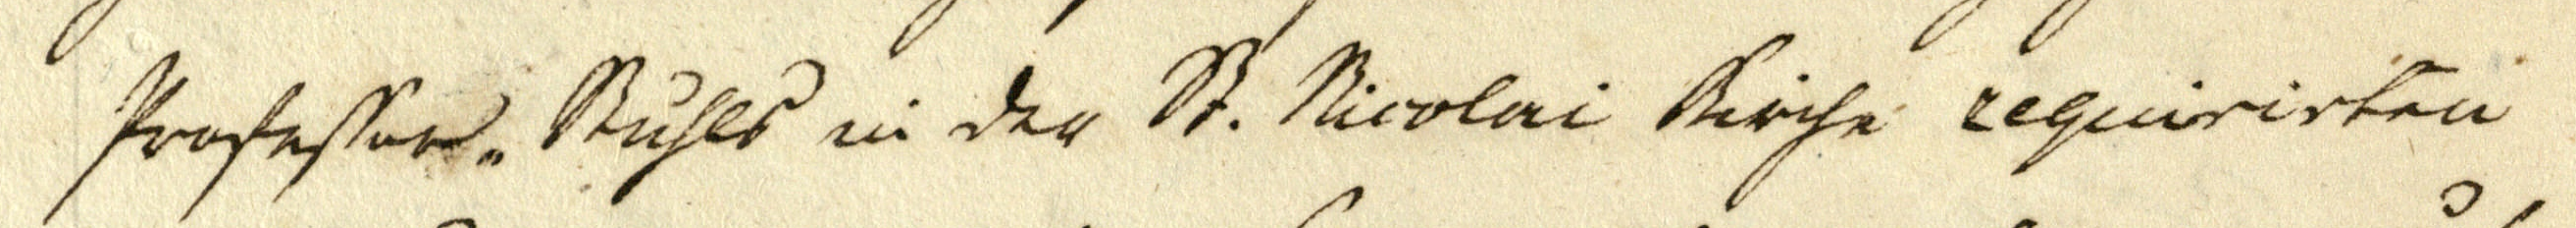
Professoren Stuhls in der St. Nicolai Kirche requirirten
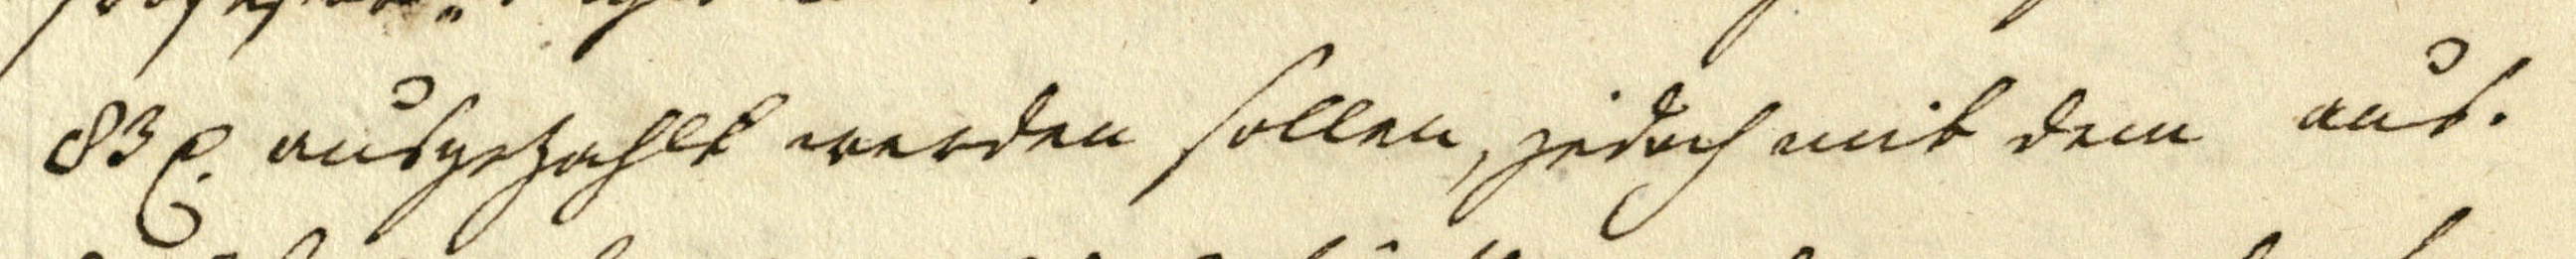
83 l. ausgezahlt werden sollen, jedoch mit dem aus¬
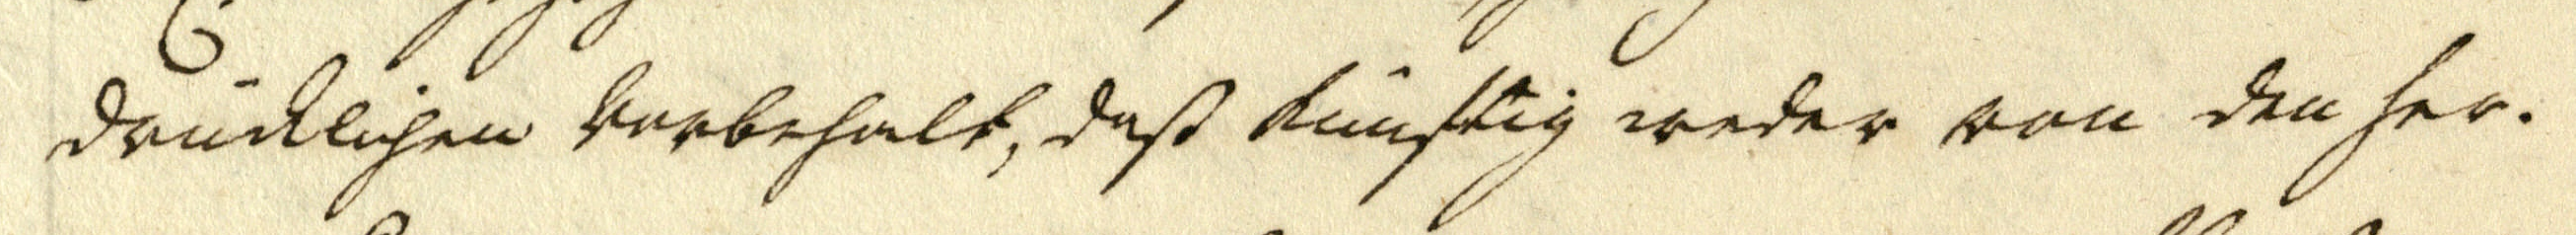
drücklichen Vorbehalt, daß künftig weder von den her¬
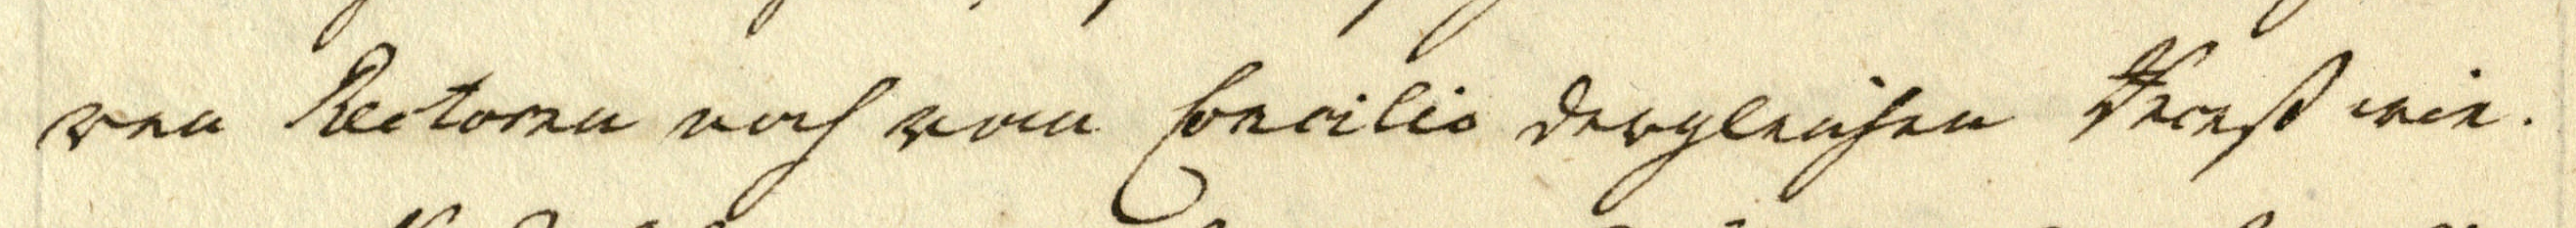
ren Rectoren noch vom Concilio dergleichen Receß wie¬
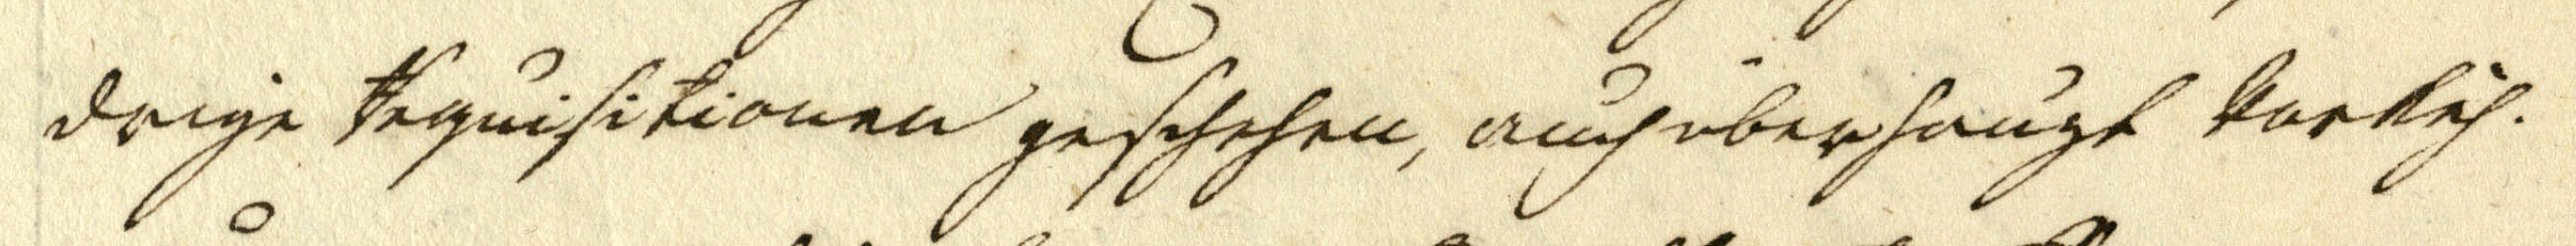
drige Requisitionen geschehen, auch überhaupt Vorkeh¬
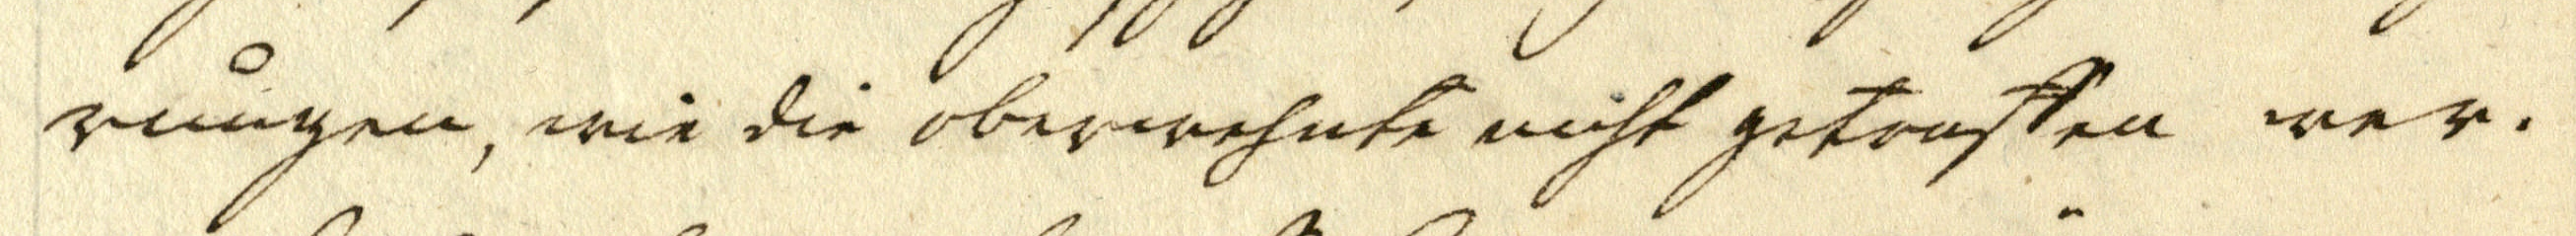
rungen, wie die oberwehnte nicht getroffen wer¬
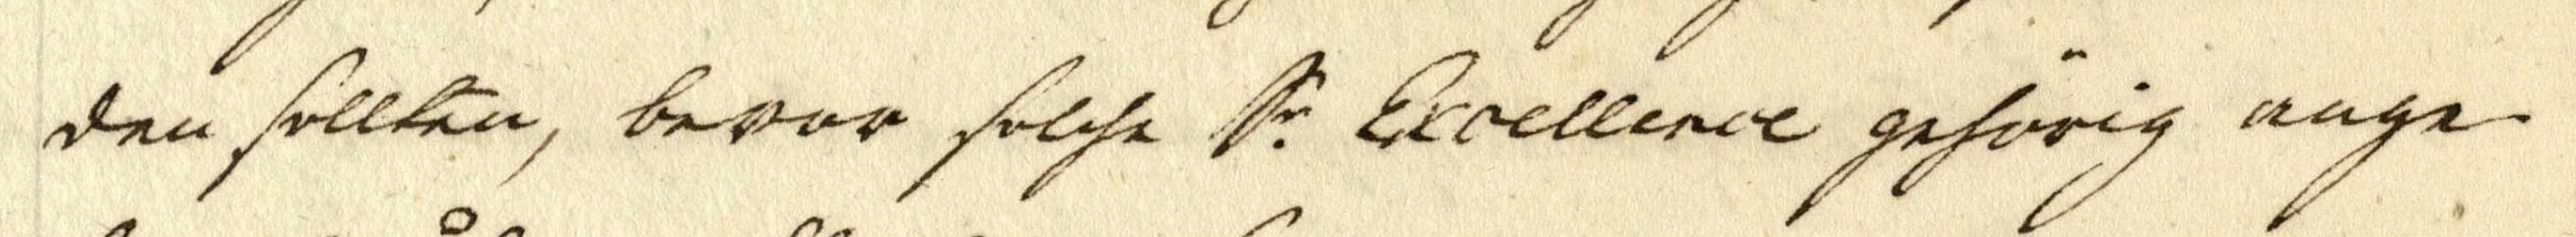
den sollten, bevor solche Sr. Excellence gehörig ange¬
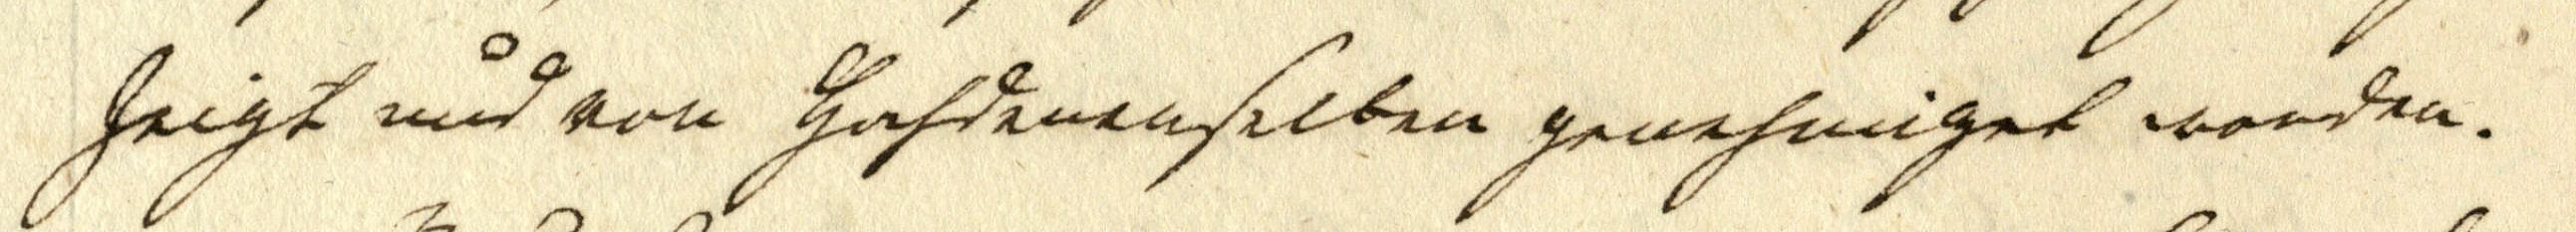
zeigt und von Hochdenenselben genehmiget worden.
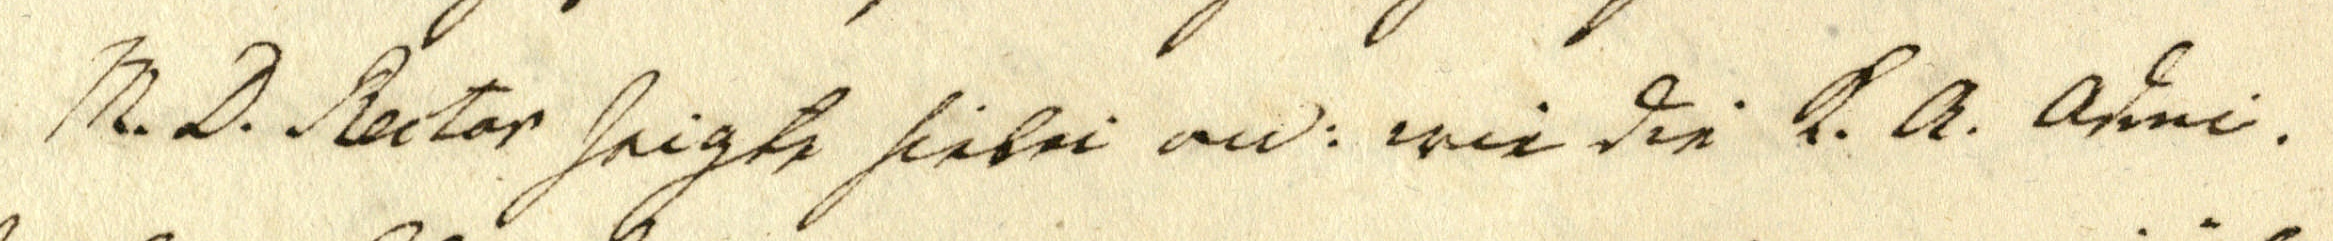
M. D. Rector zeigte hiebei an: wie die K. A. Admi¬
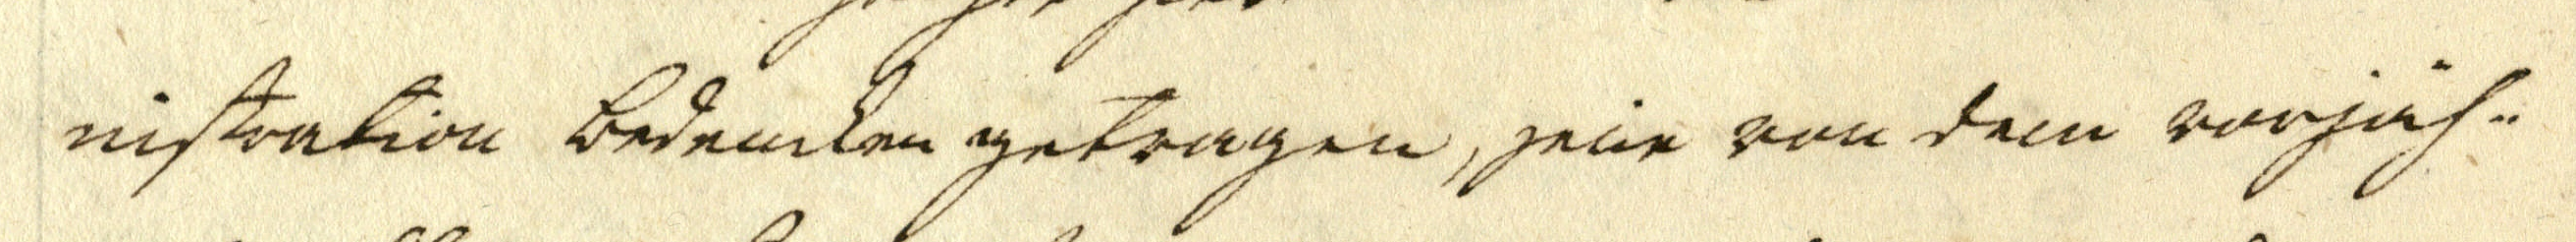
nistration Bedencken getragen, jene von dem vorjäh¬
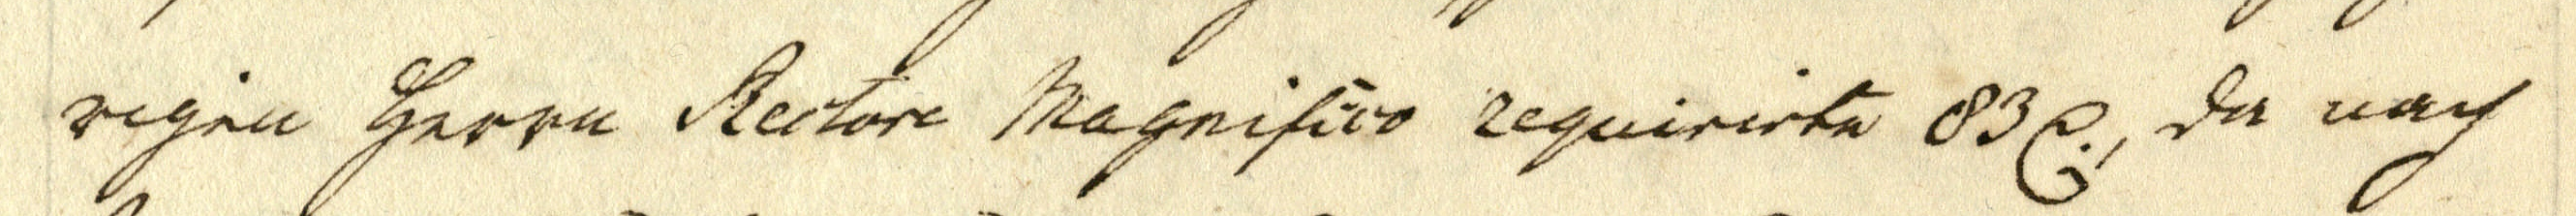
rigen Herrn Rectore Magnifico requirirte 83 l., da nach
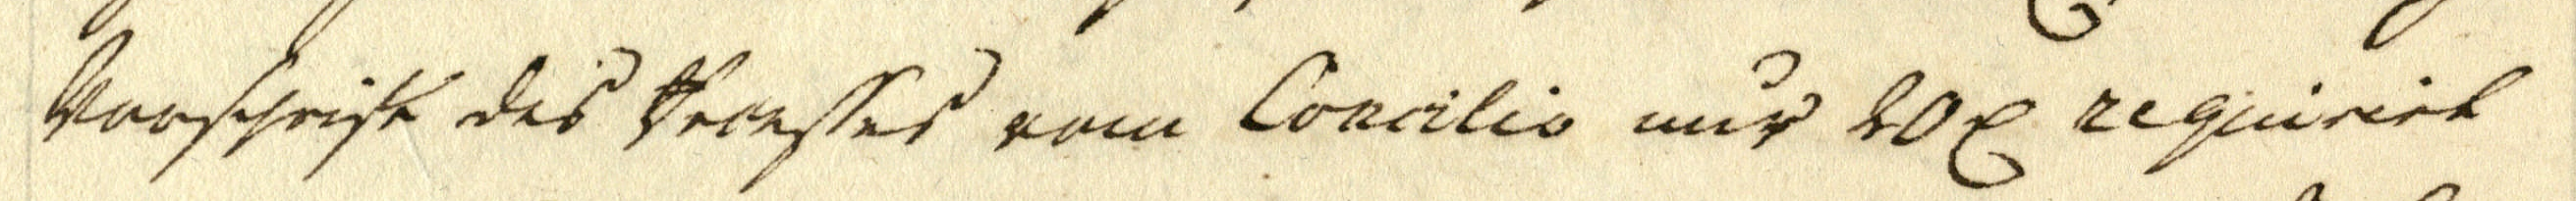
Vorschrift des Recesses vom Concilio nur 20 l. requirirt
